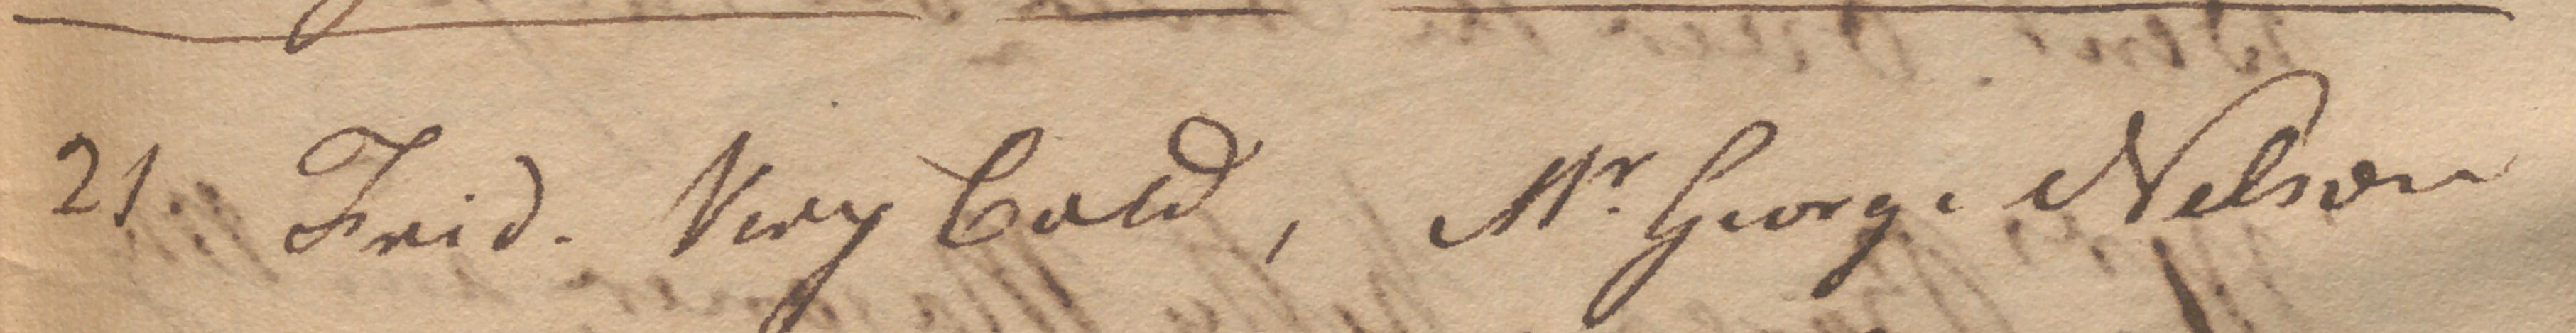21 Frid. Very Cold, M^r George Nelson
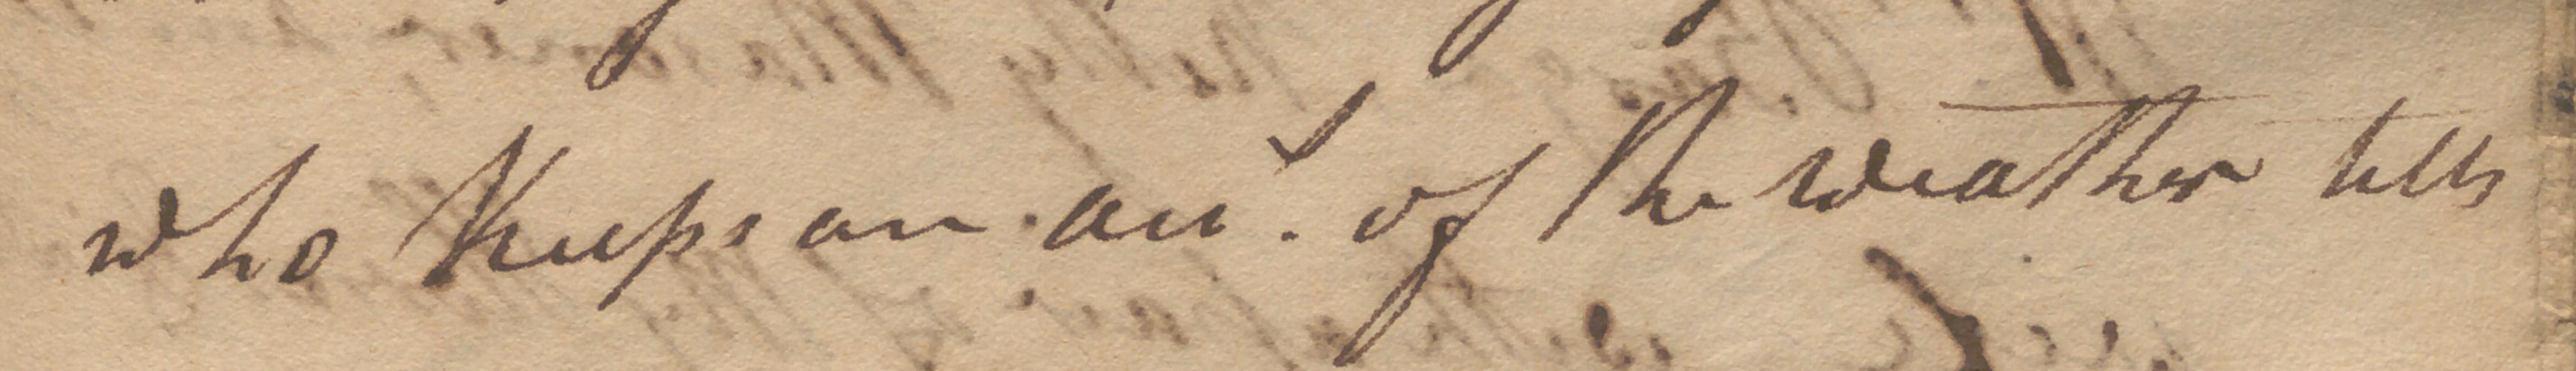who Keeps an acc^t. of the weather tells
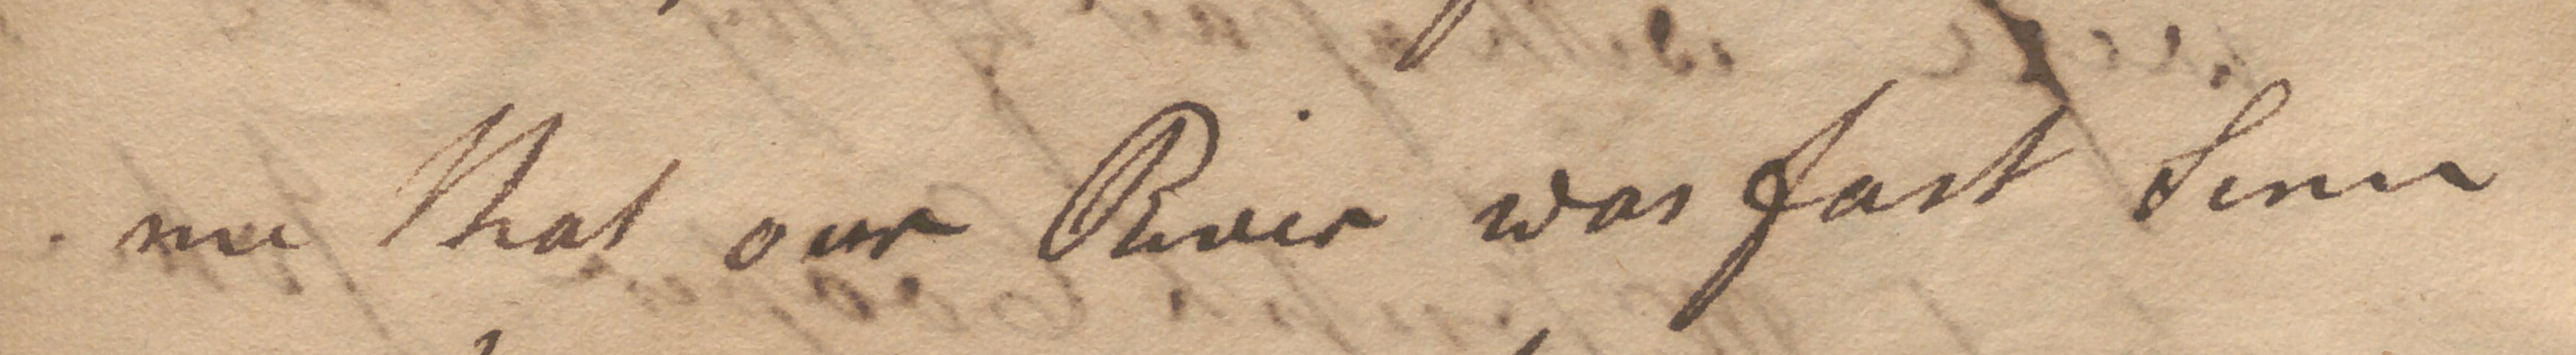me that our River was fast Since
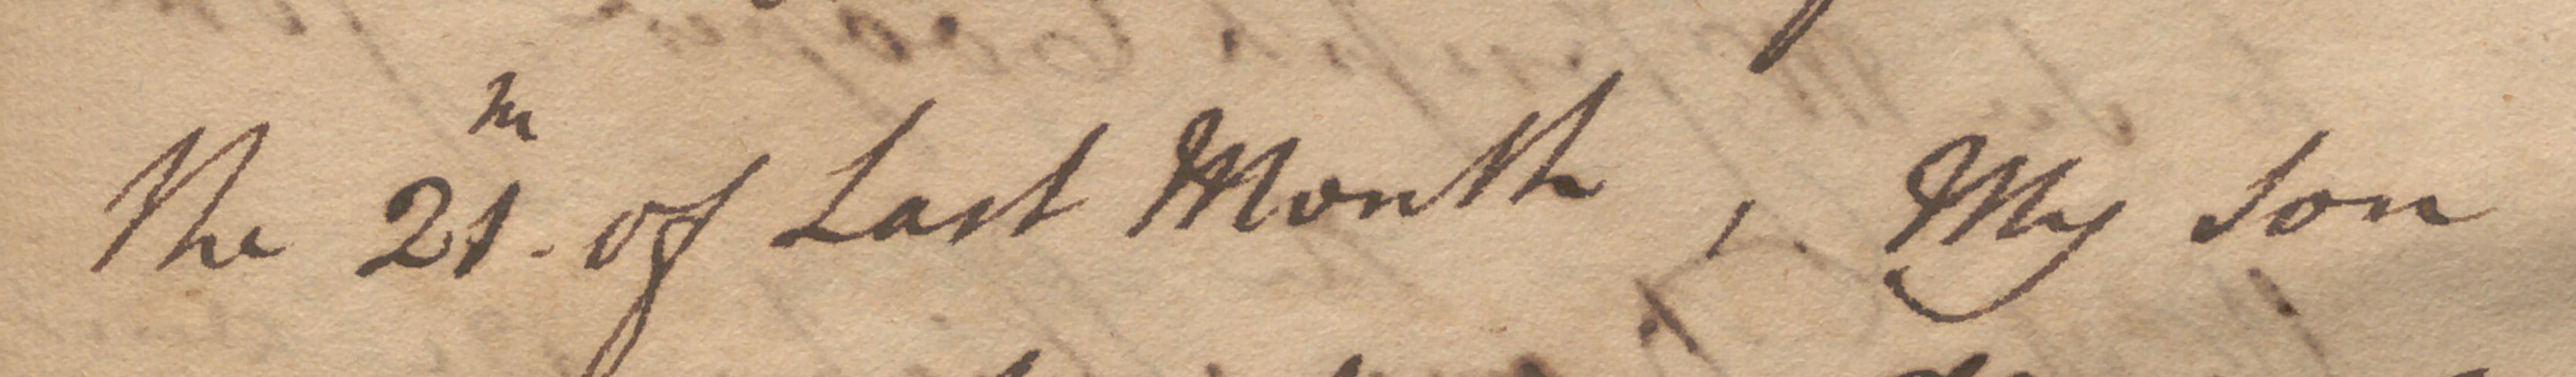The 21^th. of Last Month, My son
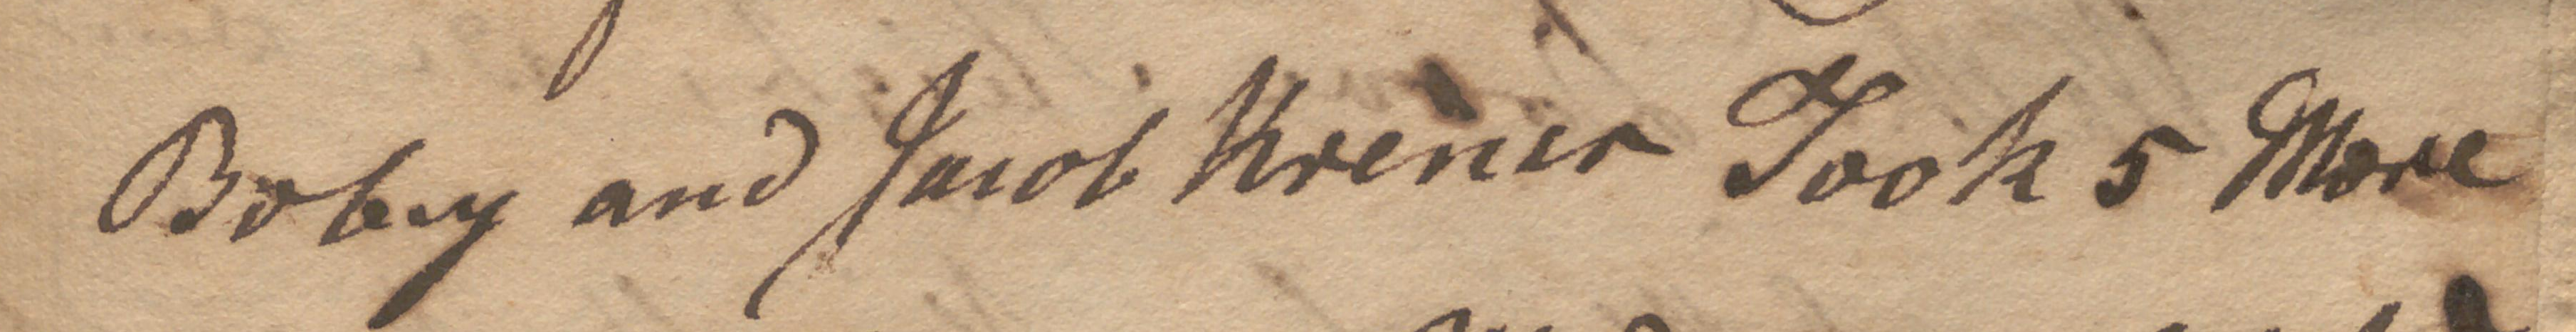Bobey and Jacob Krener Took 5 More
